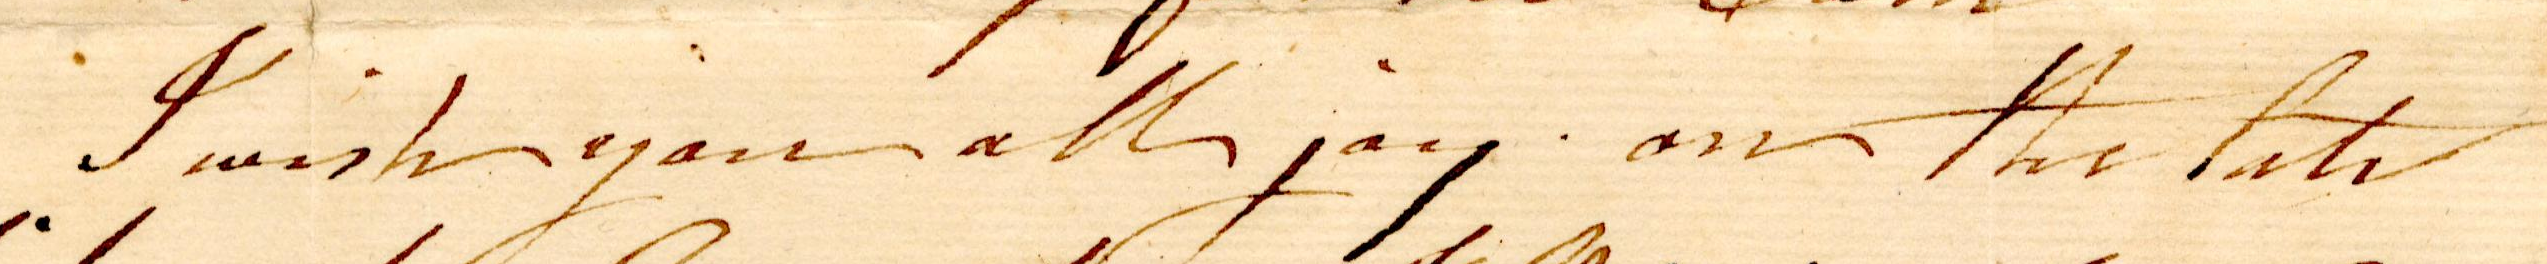I wish you all joy on the late
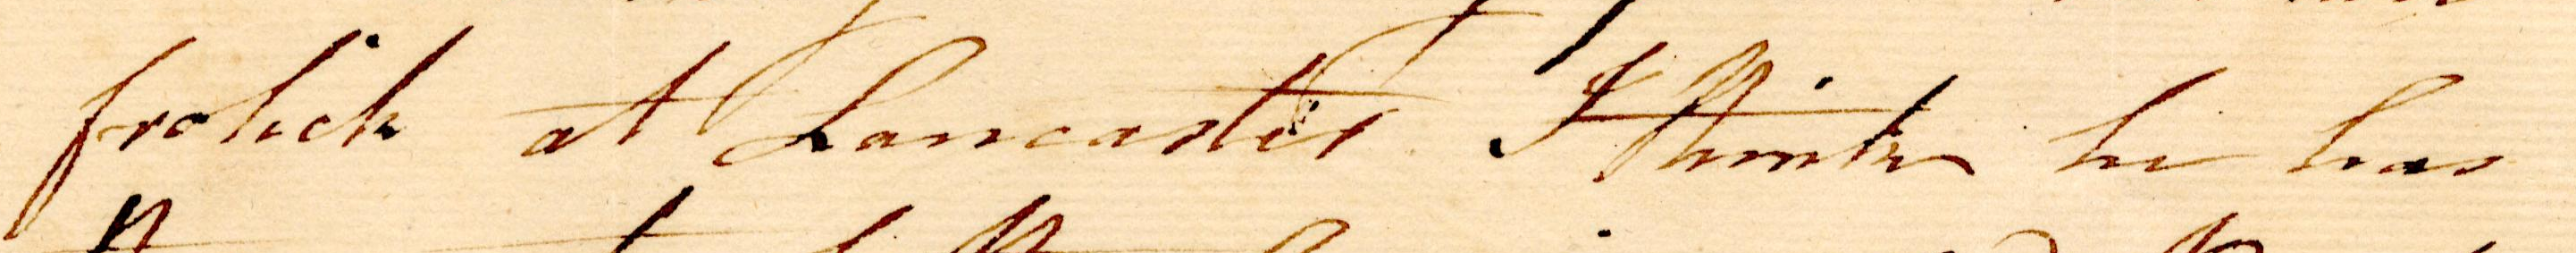frolick at Lancaster I think he has
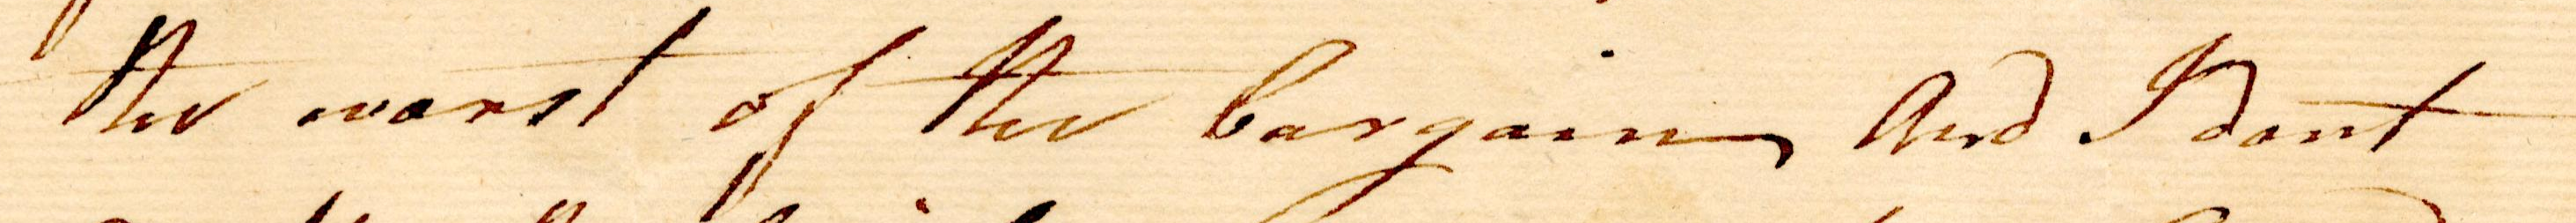the worst of the Bargain, And I dont
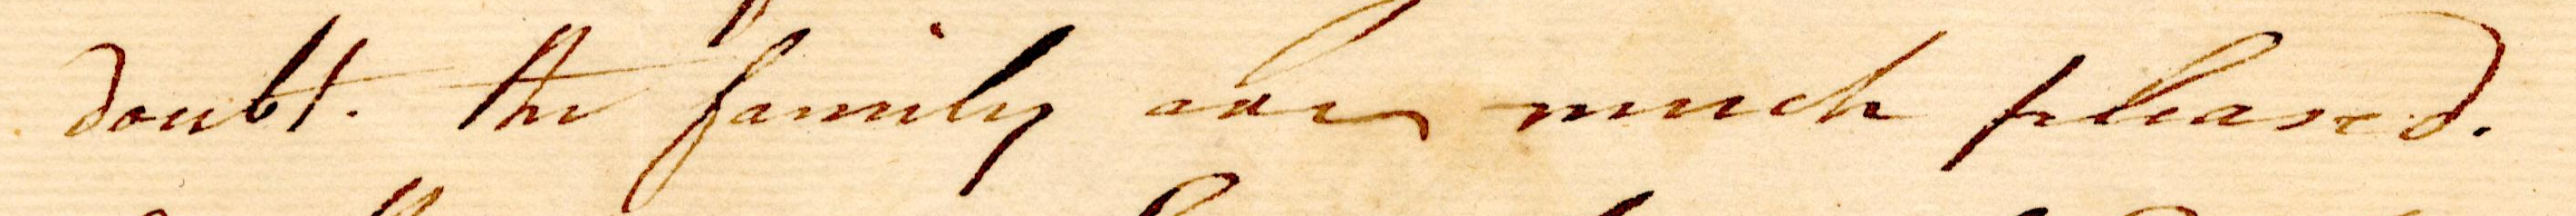doubt. the family are much pleased.
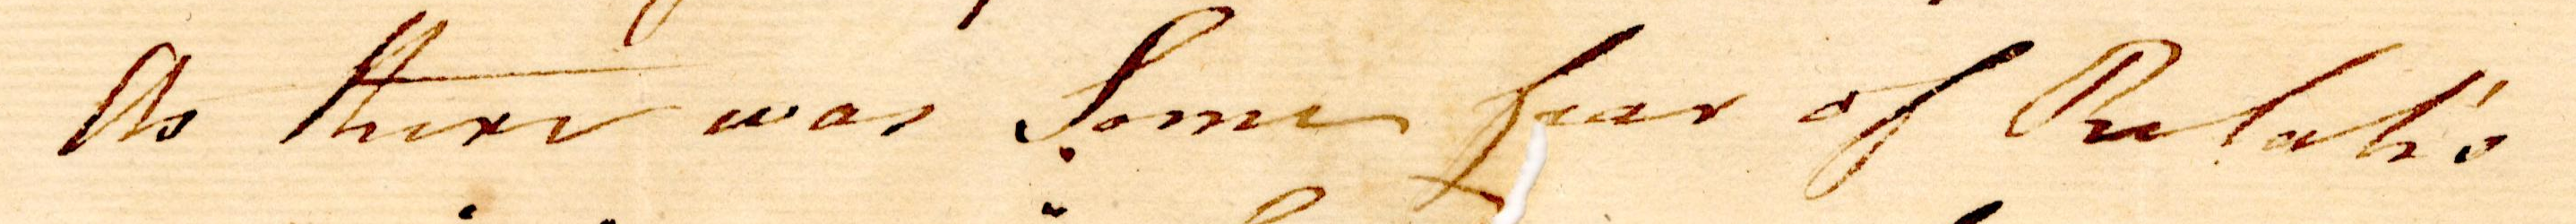to there was Some fear of Relah's
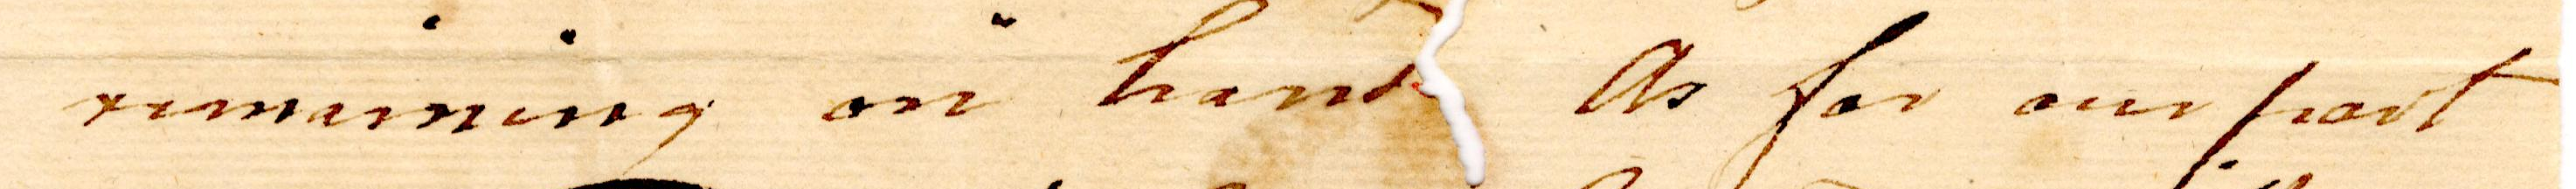remaining on hand.- As for our past
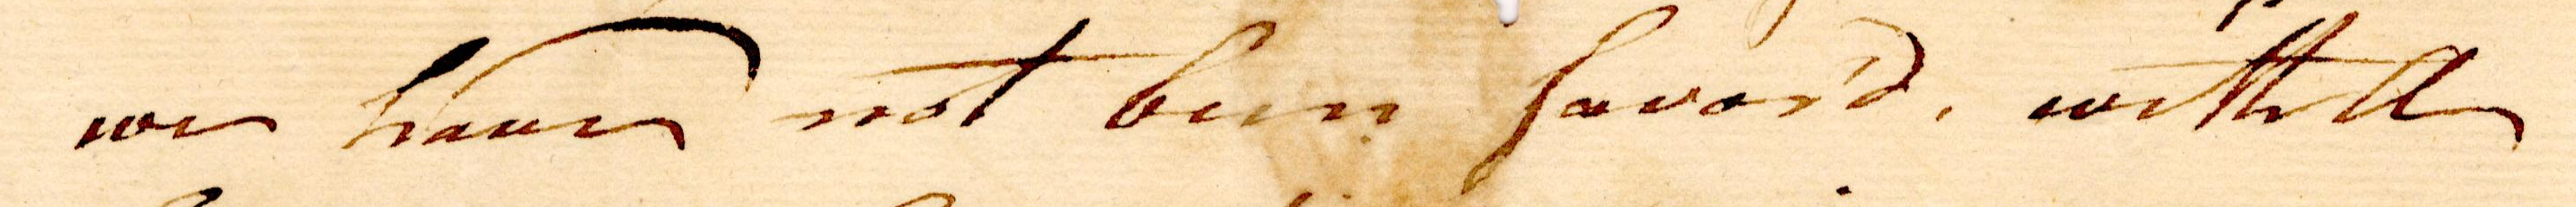we have not been favor'd, with a
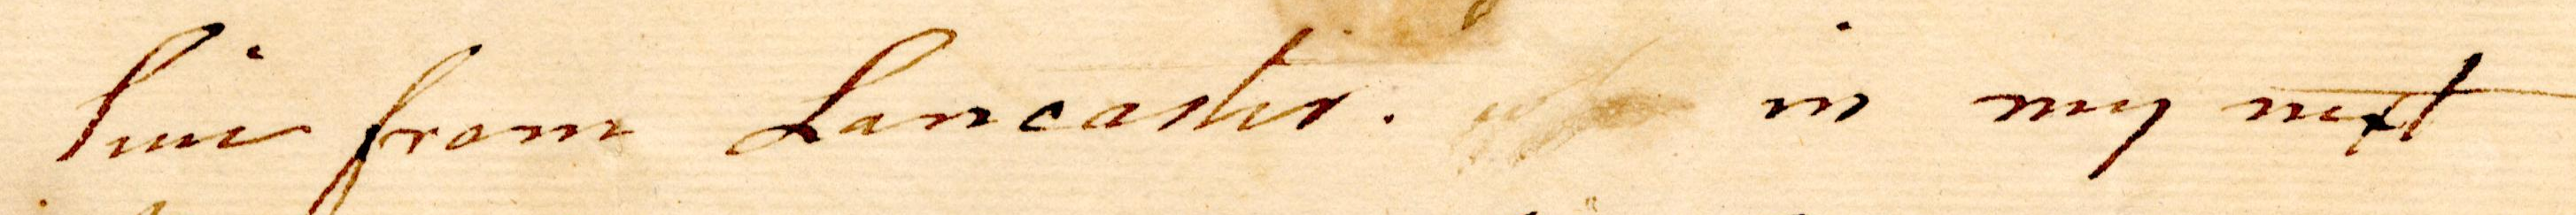line from Lancaster.- [___] in my next
